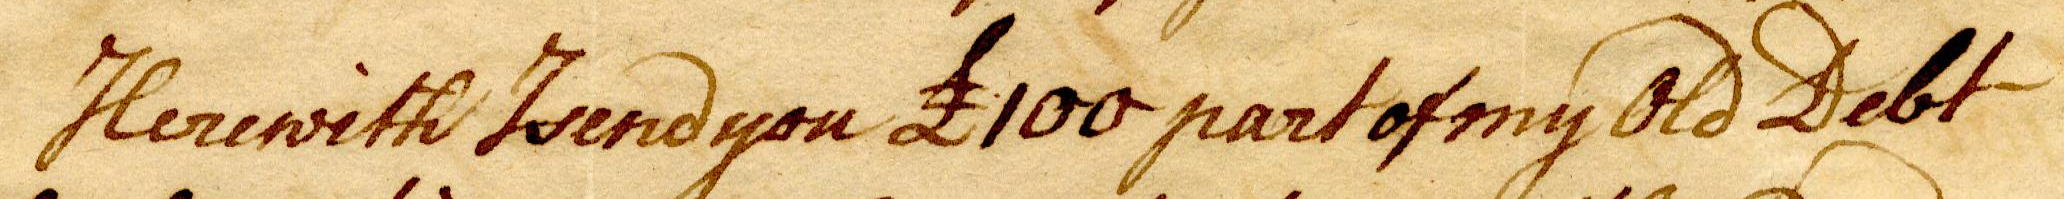Herewith I send you £100 part of my Old Debt
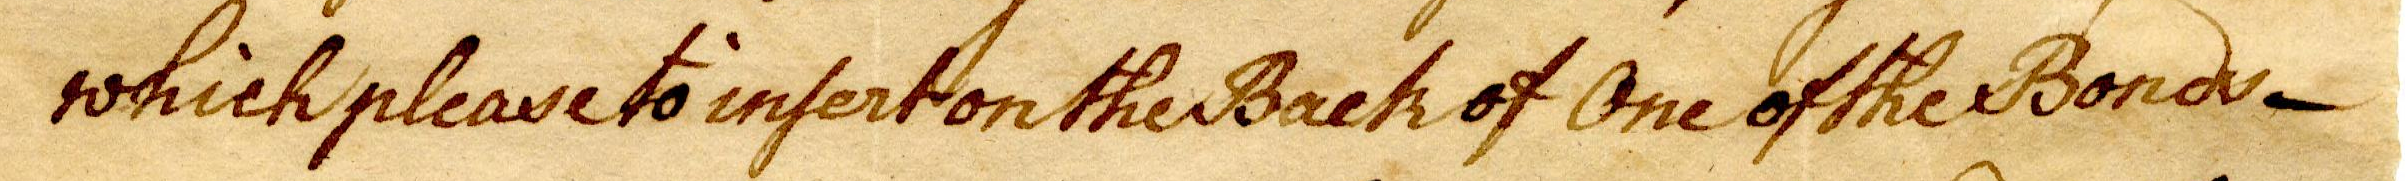which please to insert on the Back of One of the Bonds-
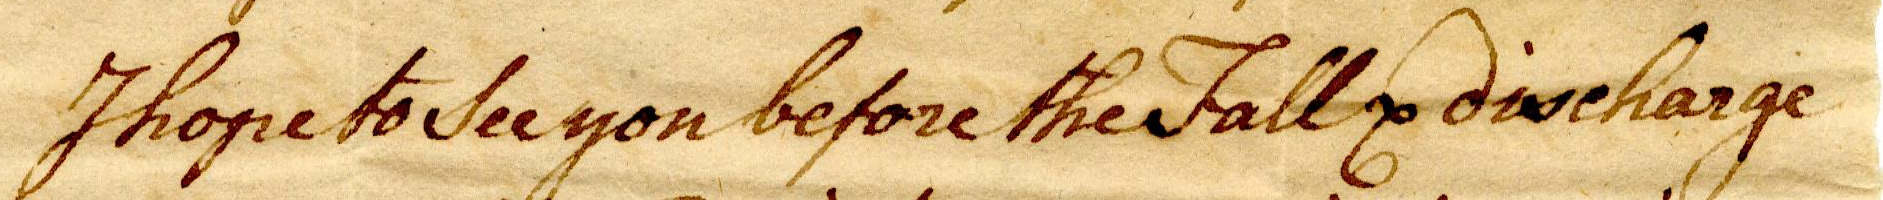I hope to see you before the Fall & discharge
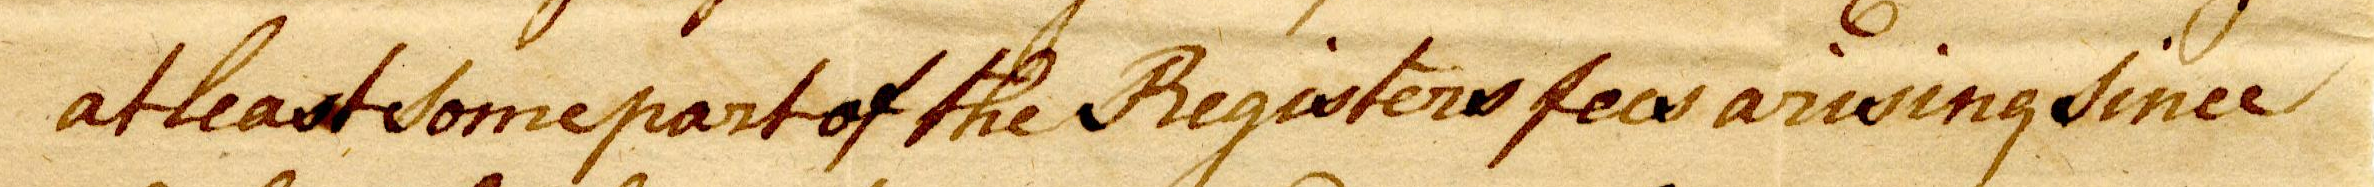at least some part of the Registers fees arriving since
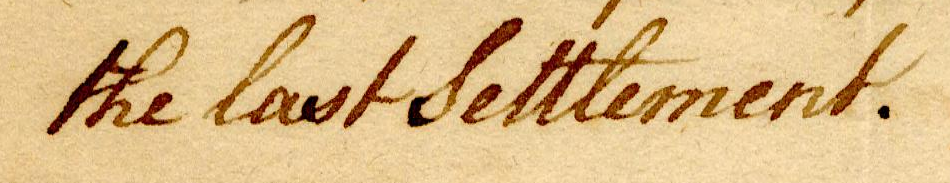the last Settlement.
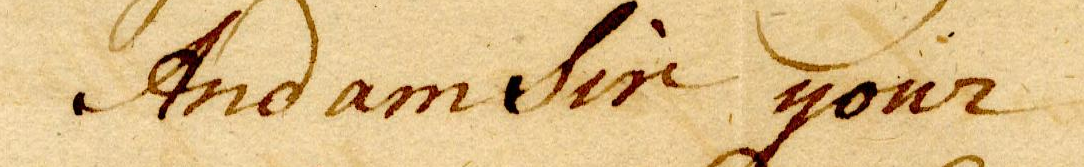And am Sir your
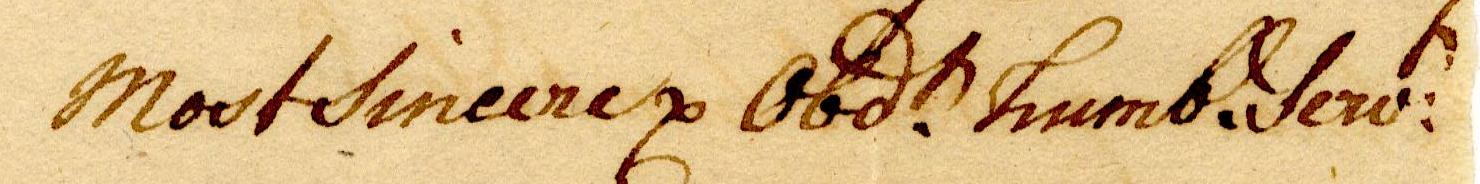Most Sincere & Obd^t. humb^l. Serv^t.
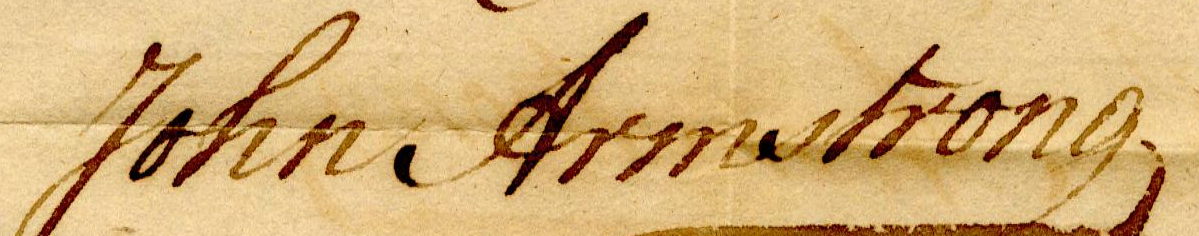John Armstrong
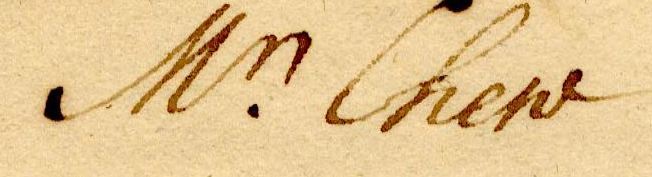M^r. Chew
